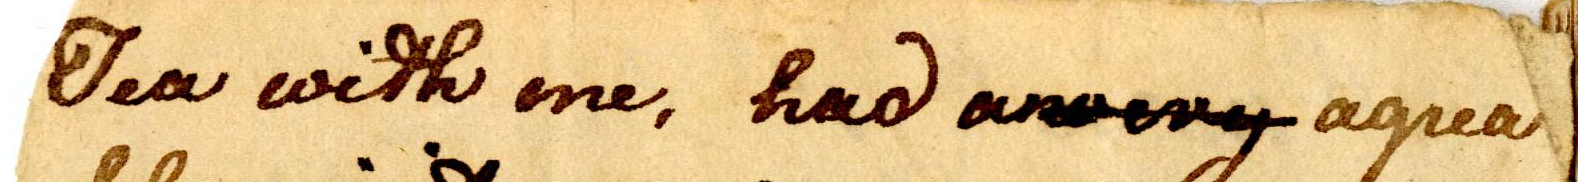Tea with me, had an [very] agrea
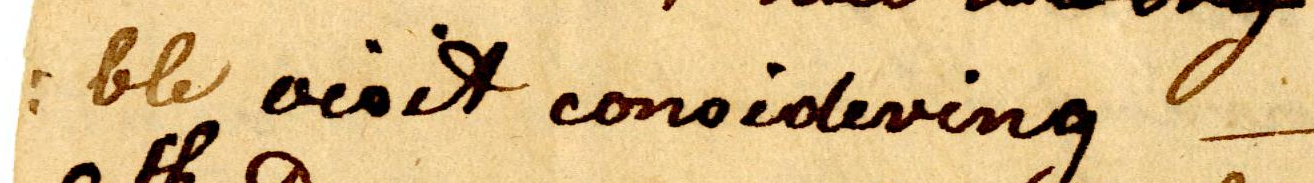-ble visit considering-
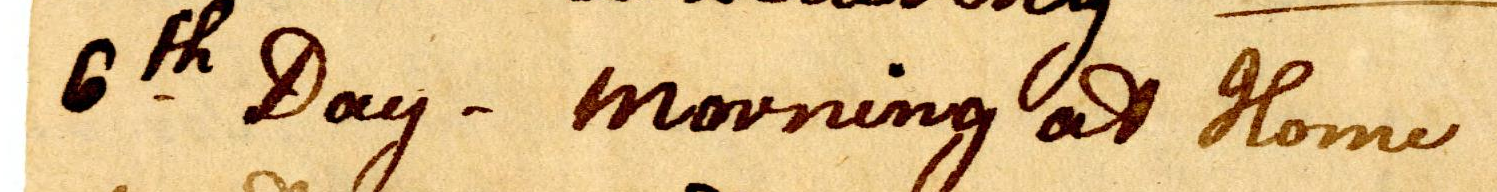6^th Day- Morning at Home
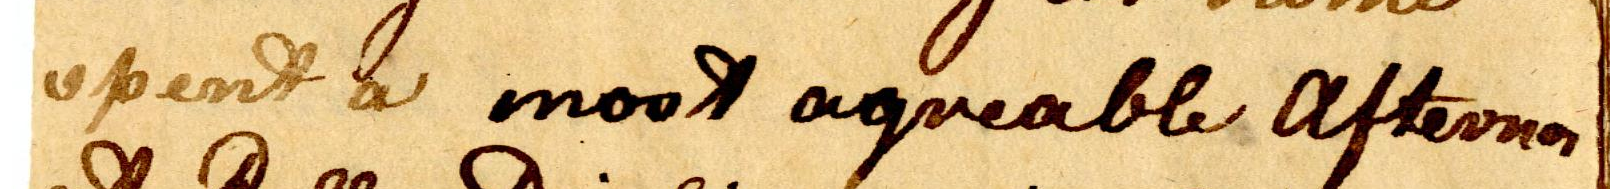spent a most agreable Afternon
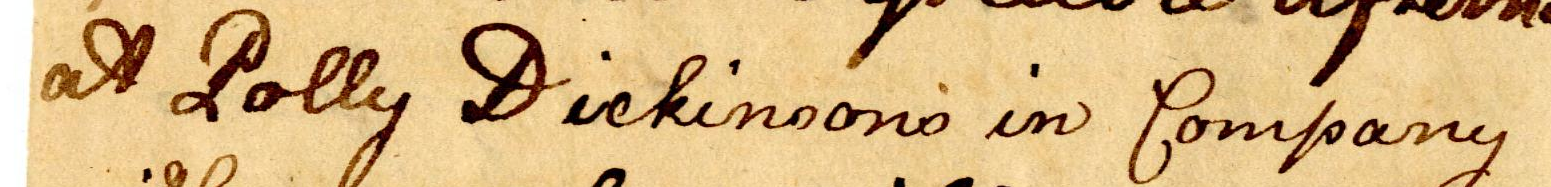at Polly Dickinsons in Company
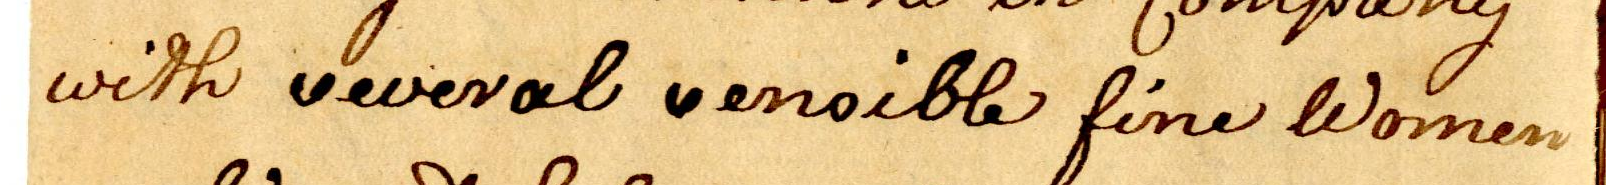with several sensible fine Women
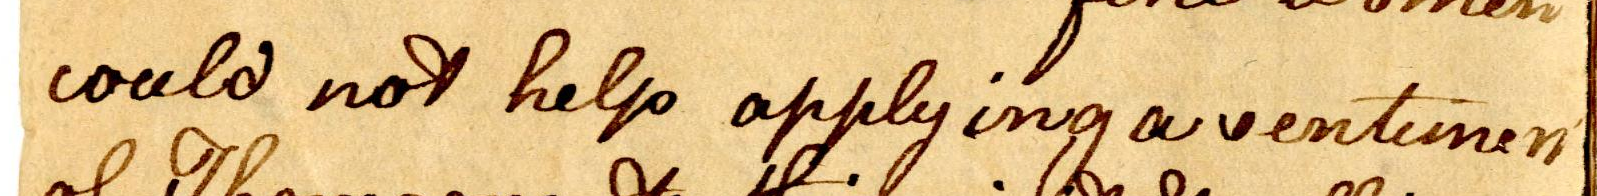could not help applying a sentimen
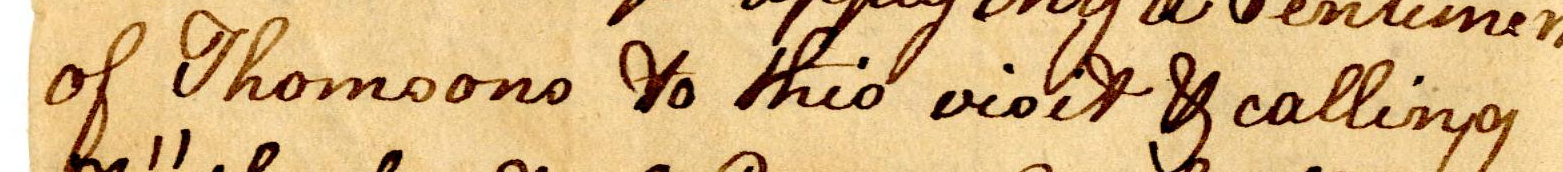of Thomsons to this visit & calling
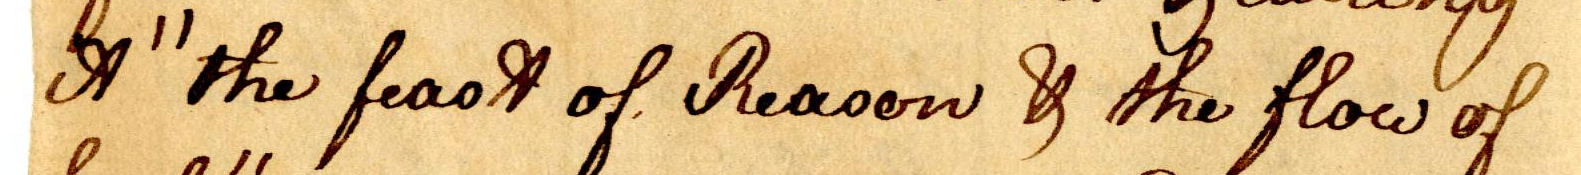it " the feast of Reason & the flow of
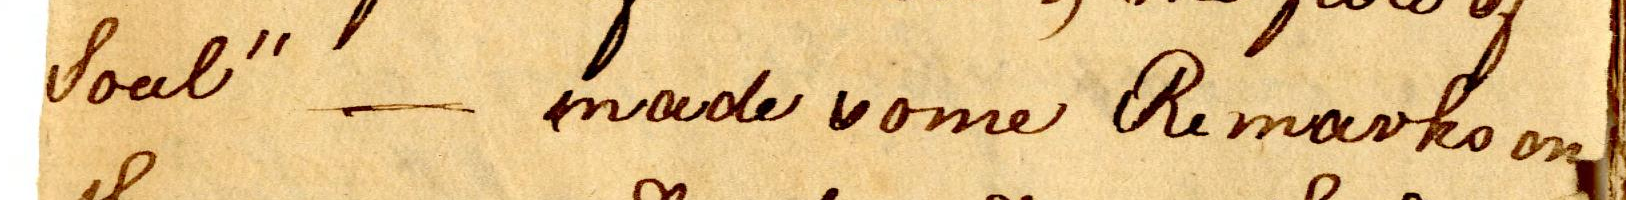Soul" - made some Remarks on
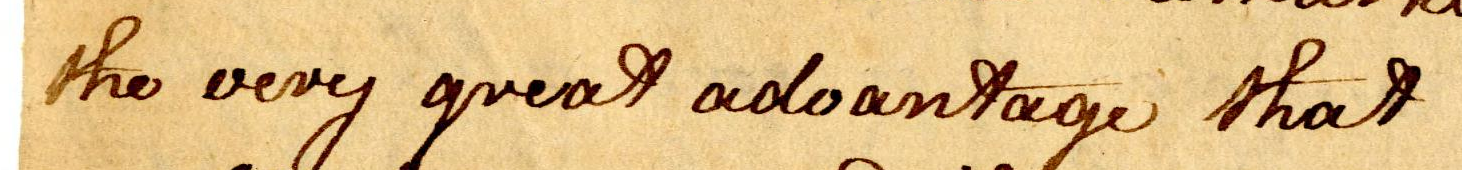the very great advantage that
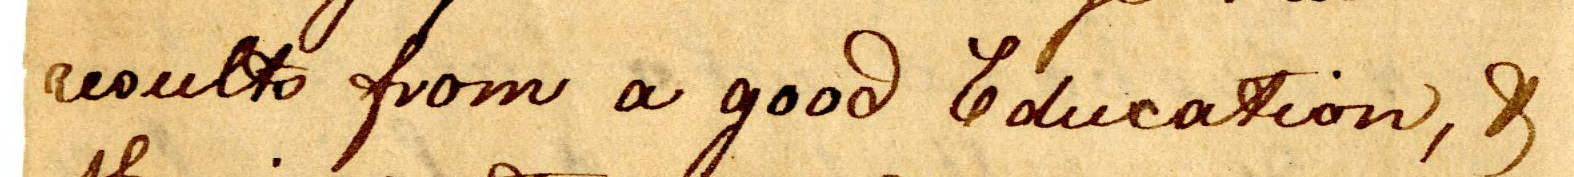results from a good Education, &
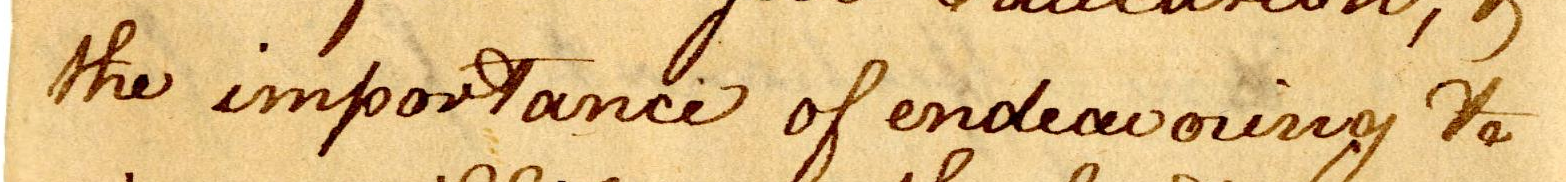the importance of endeavoring to
